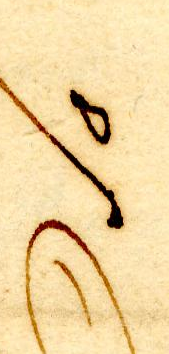To
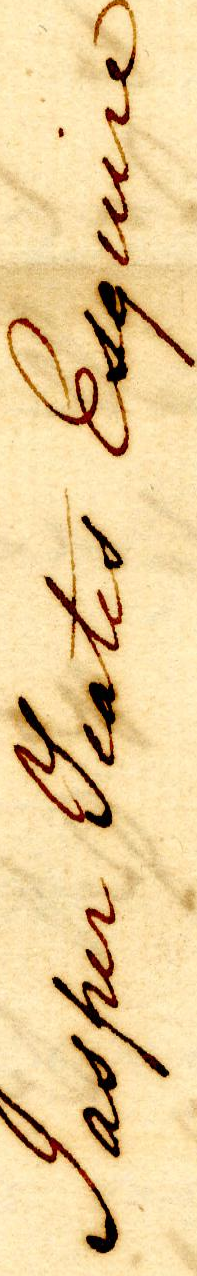Jasper Yeates Esquire
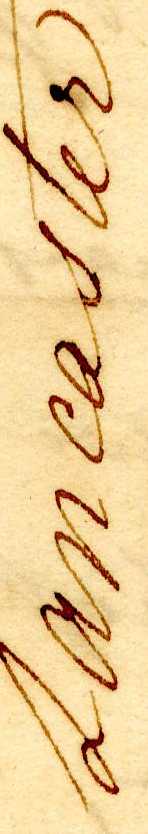Lancaster
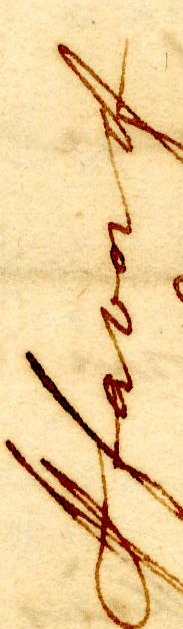Per favor of
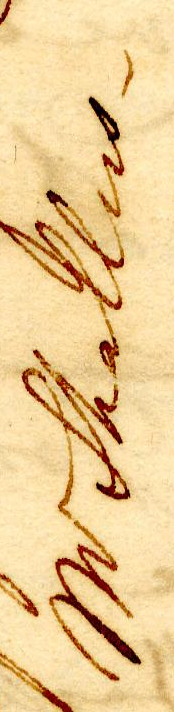M^r Shallus
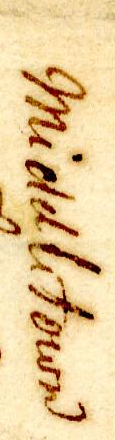Middletown
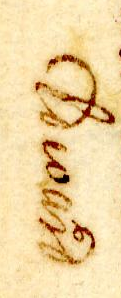Edward
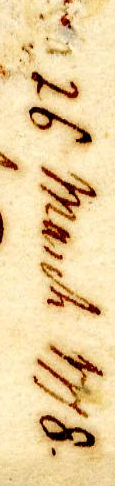26 March 1778.
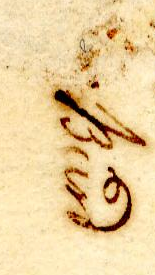Burd
